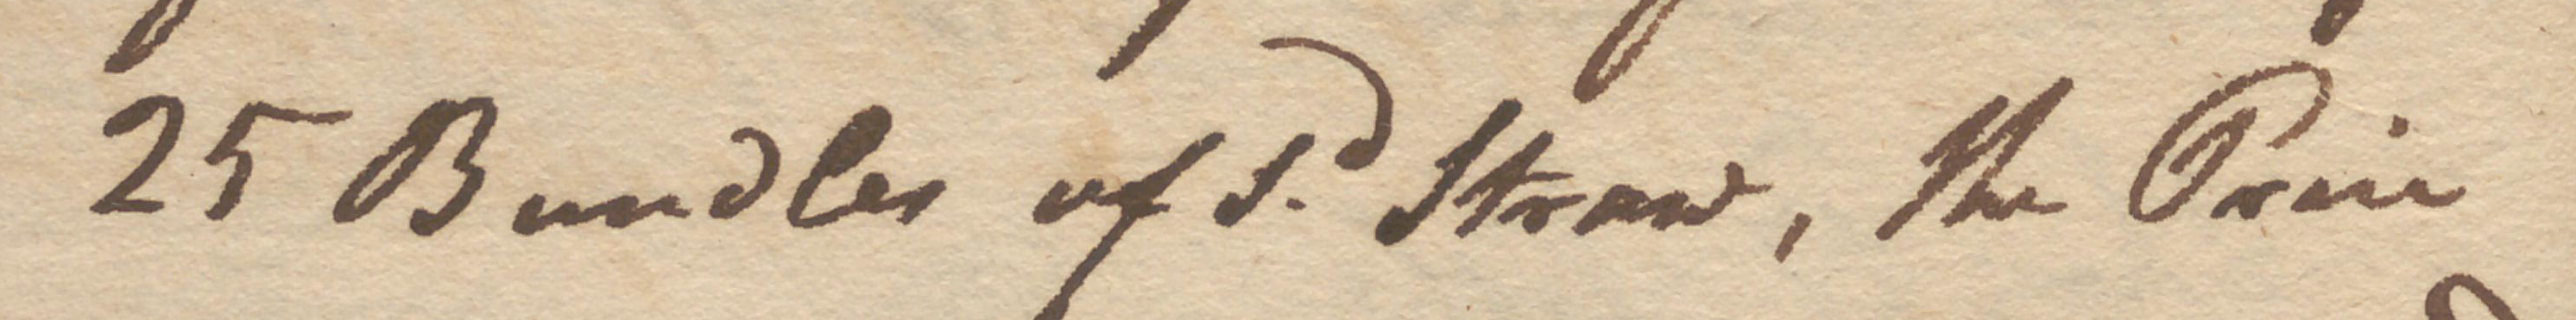25 Bundles of s^d. Straw, the Price
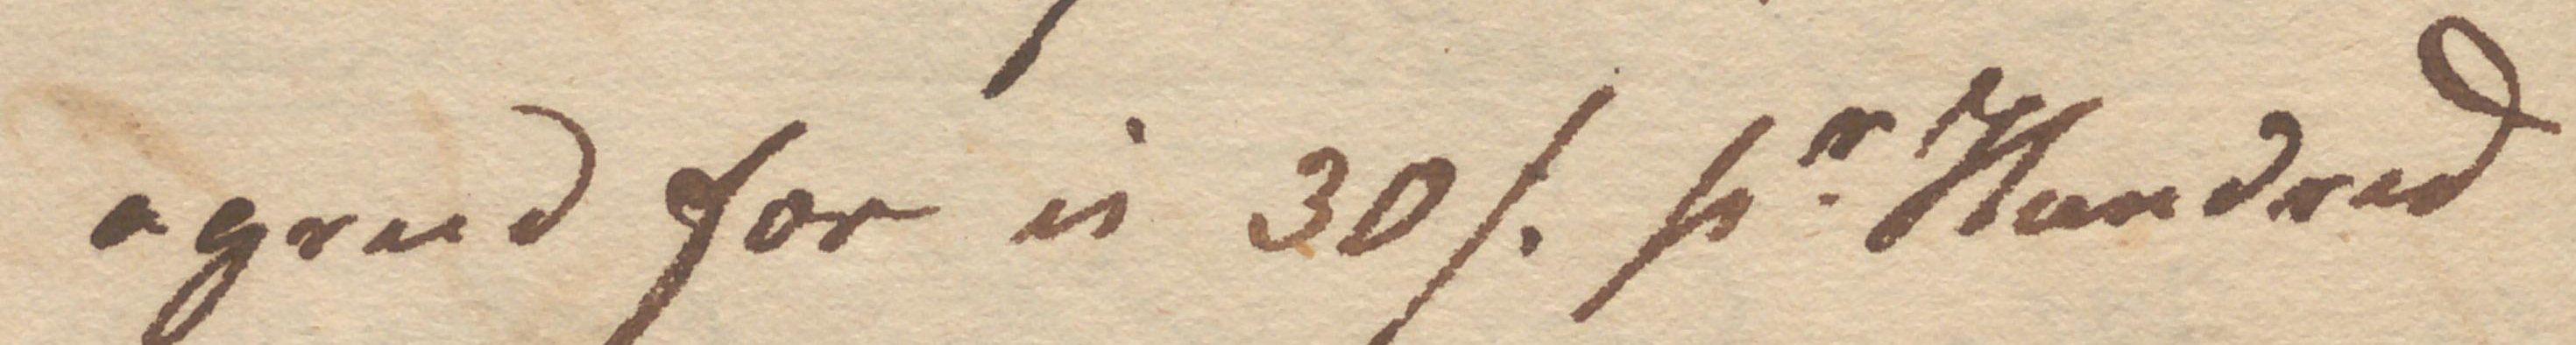agreed for is 30s. p^r. Hundred
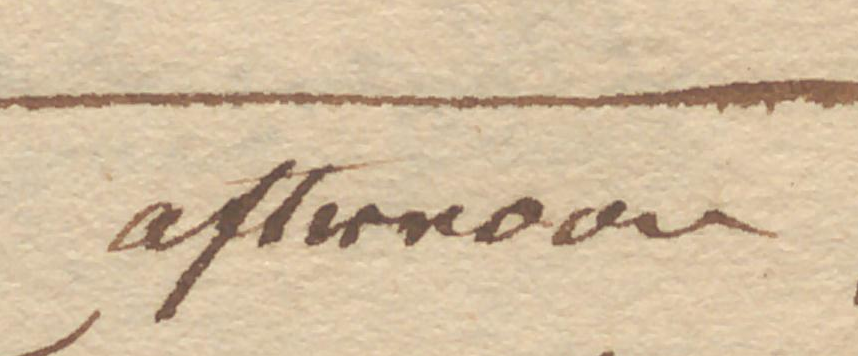afternoon
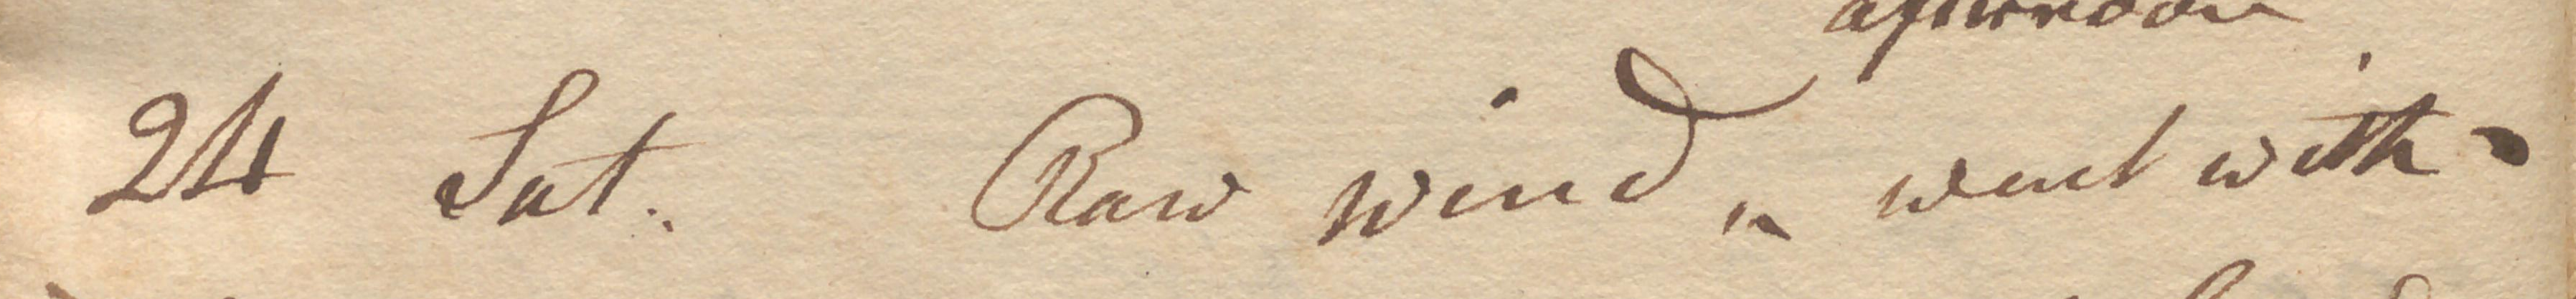24 Sat. Raw wind, went with
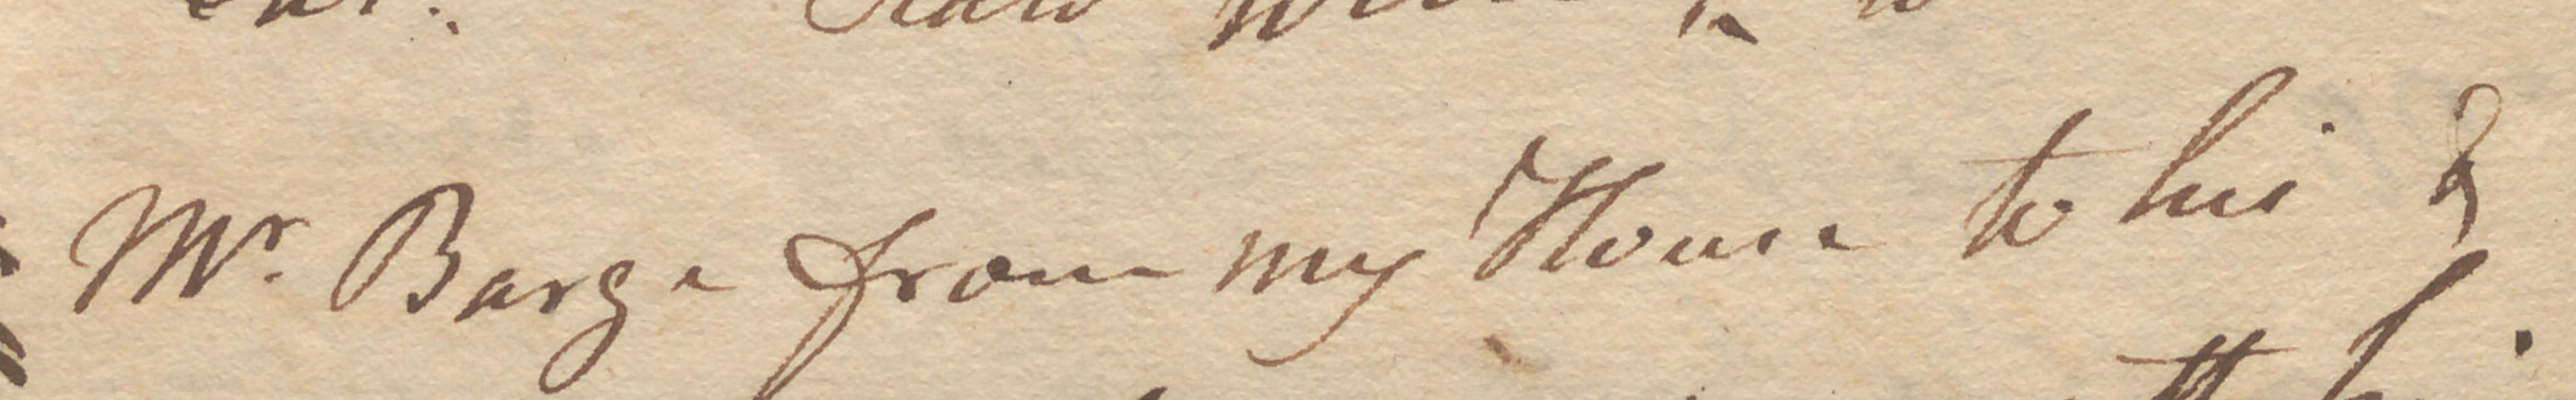M^r. Barge from my House to his &
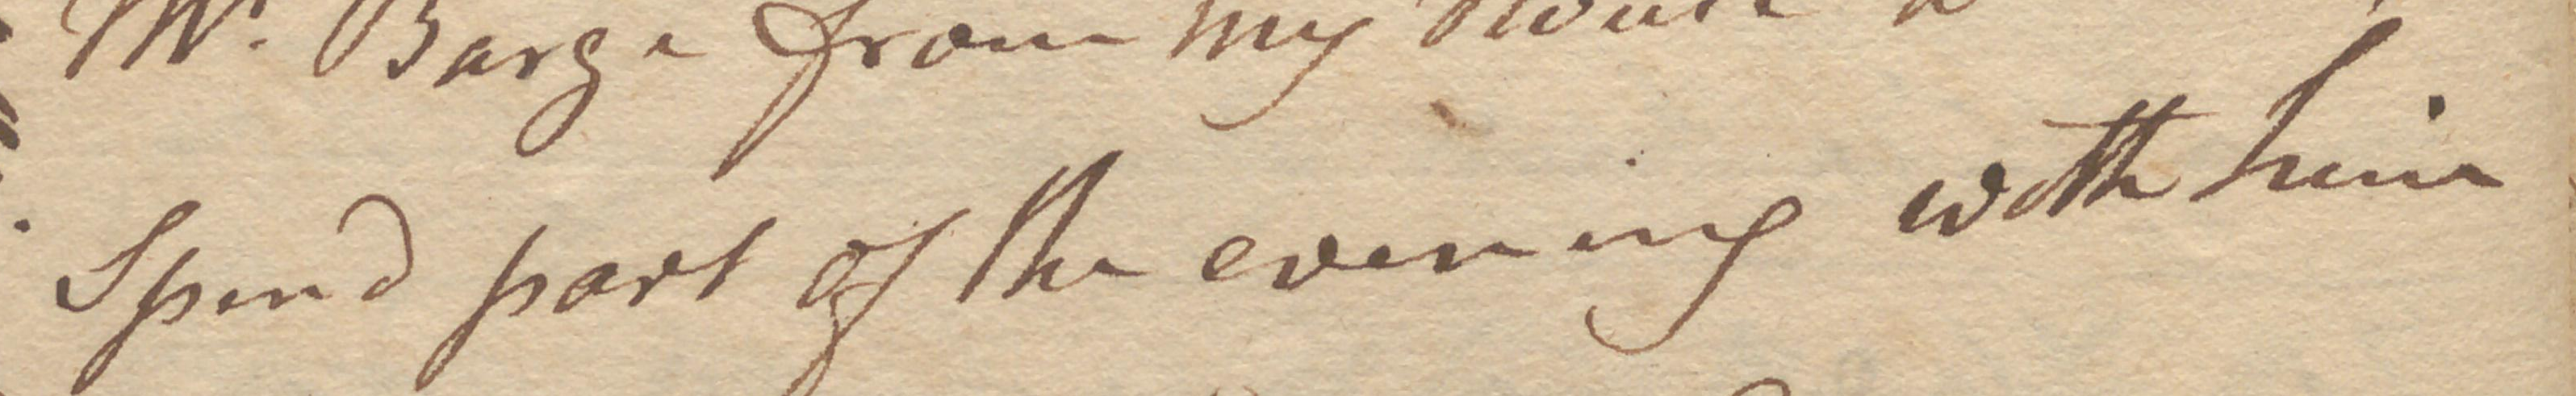spend part of the evening with him
